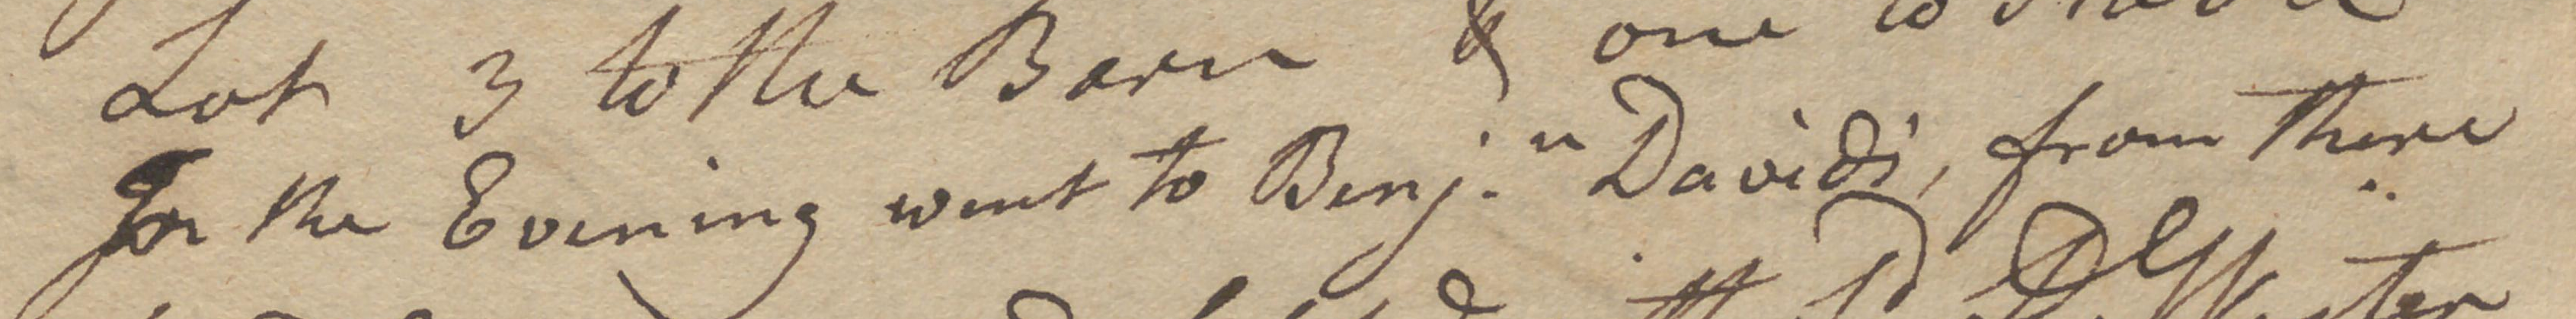In the Evening went to Beng^n Davids, from there
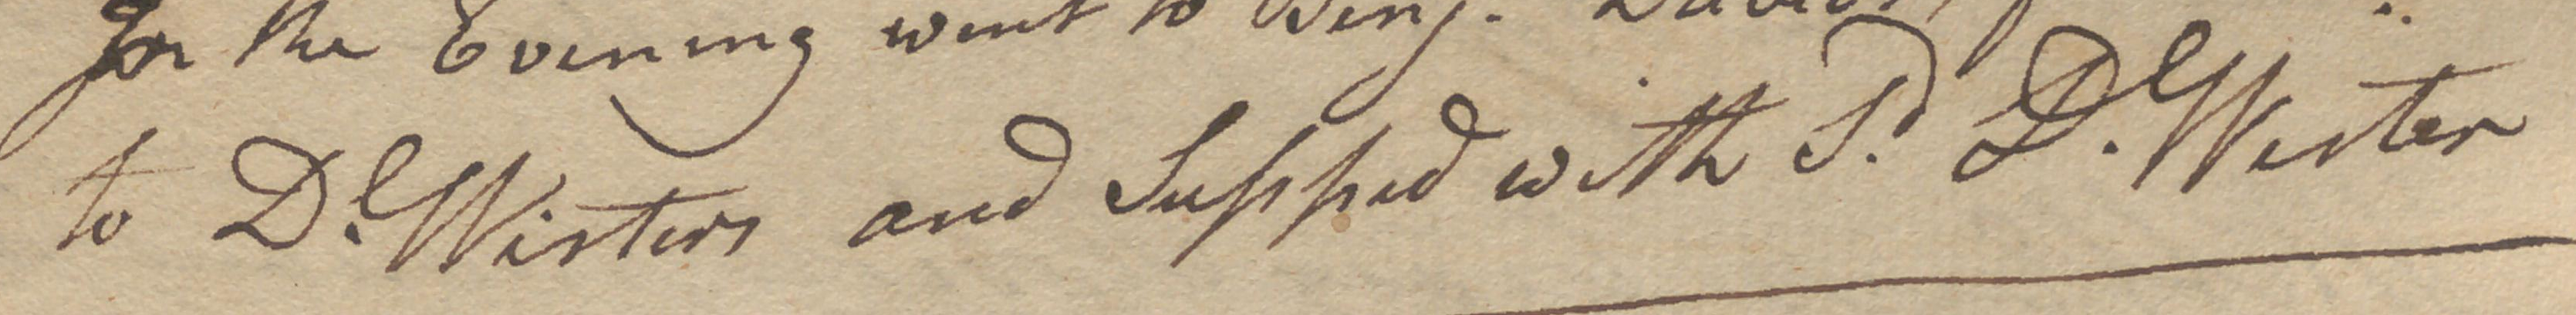to D^l. Wisters and Supped with s^d. D^l. Wister
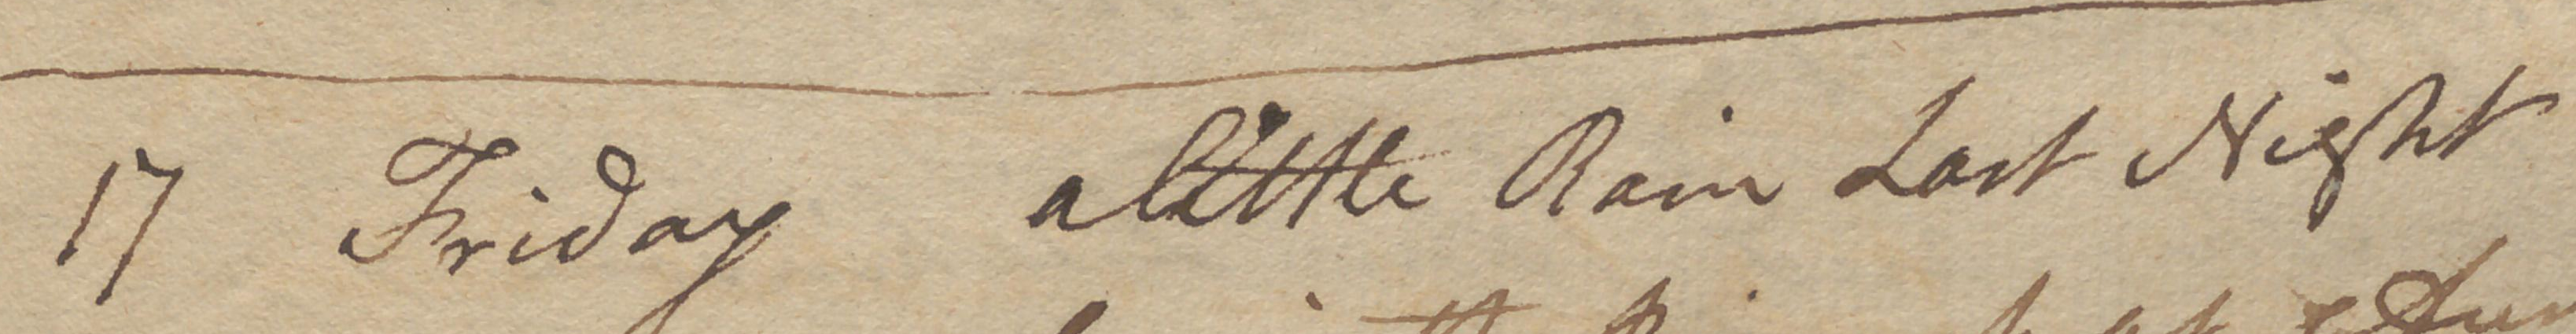17 Friday, a little Rain Last Night
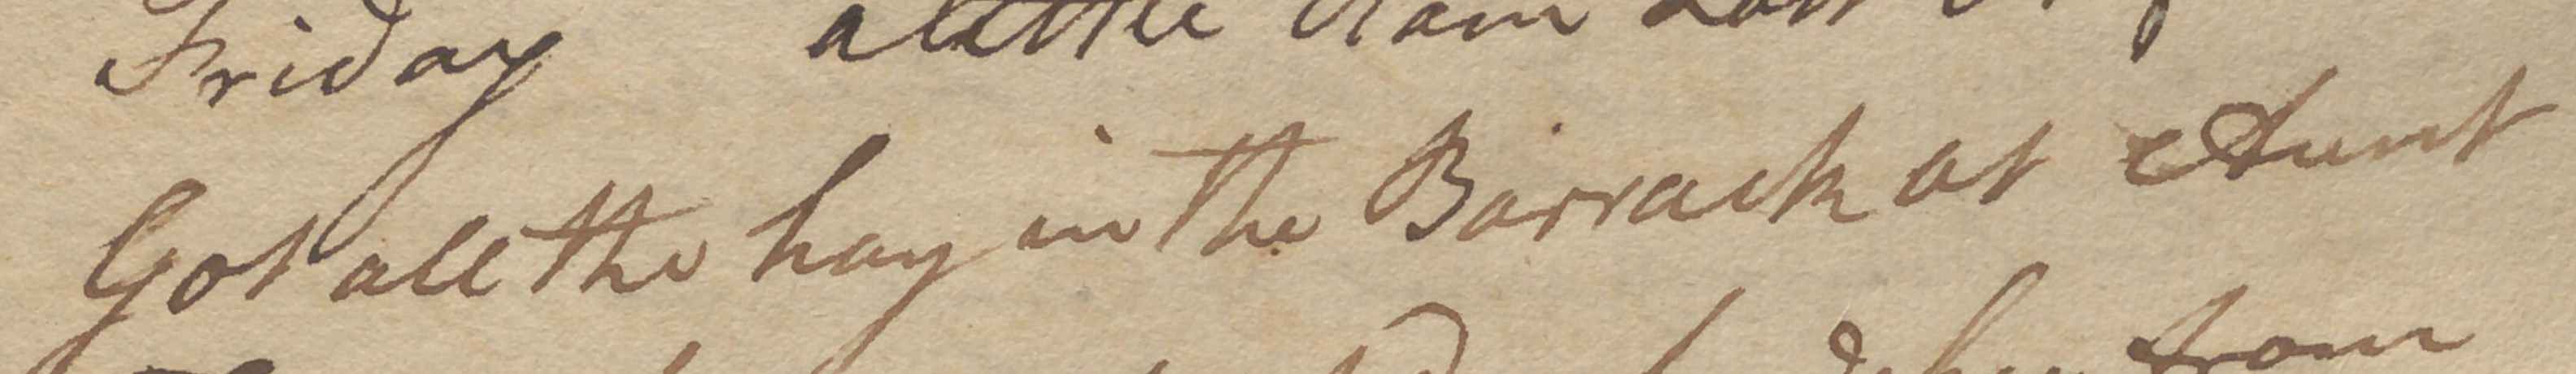Got all the hay in the Barrack at Aunt
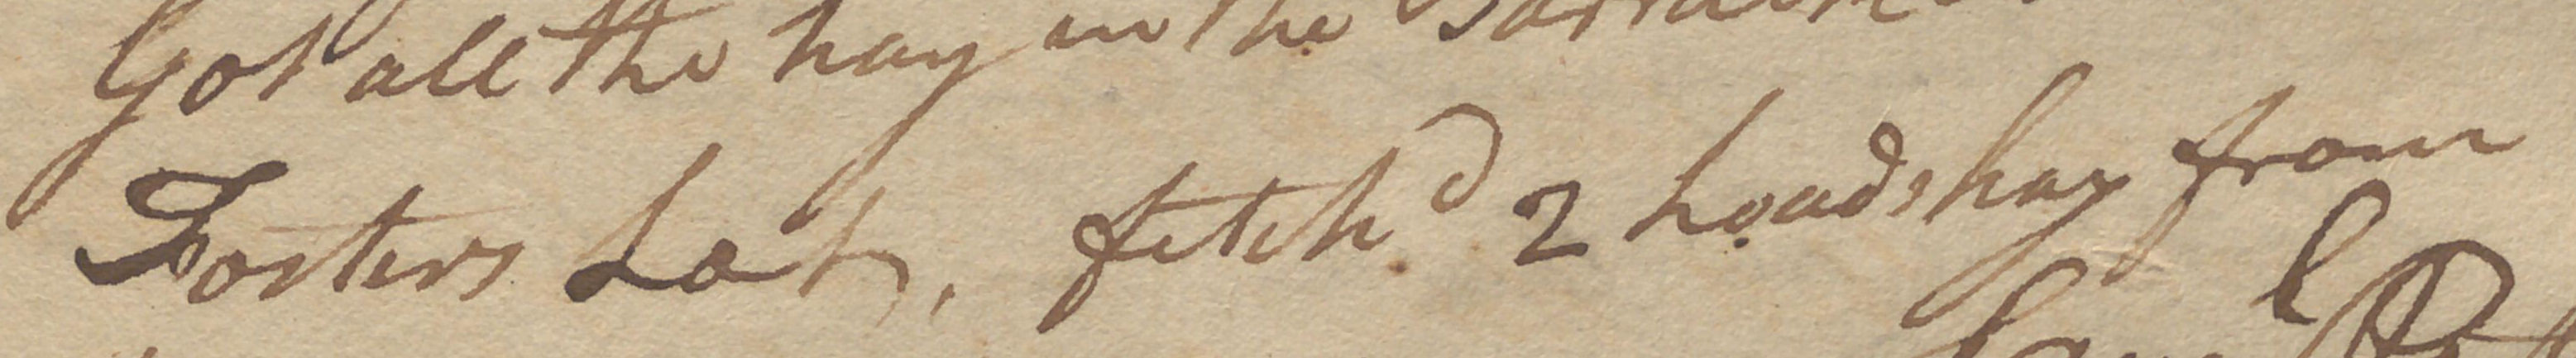Fosters Lot. fetch^d. 2 Loads hay from
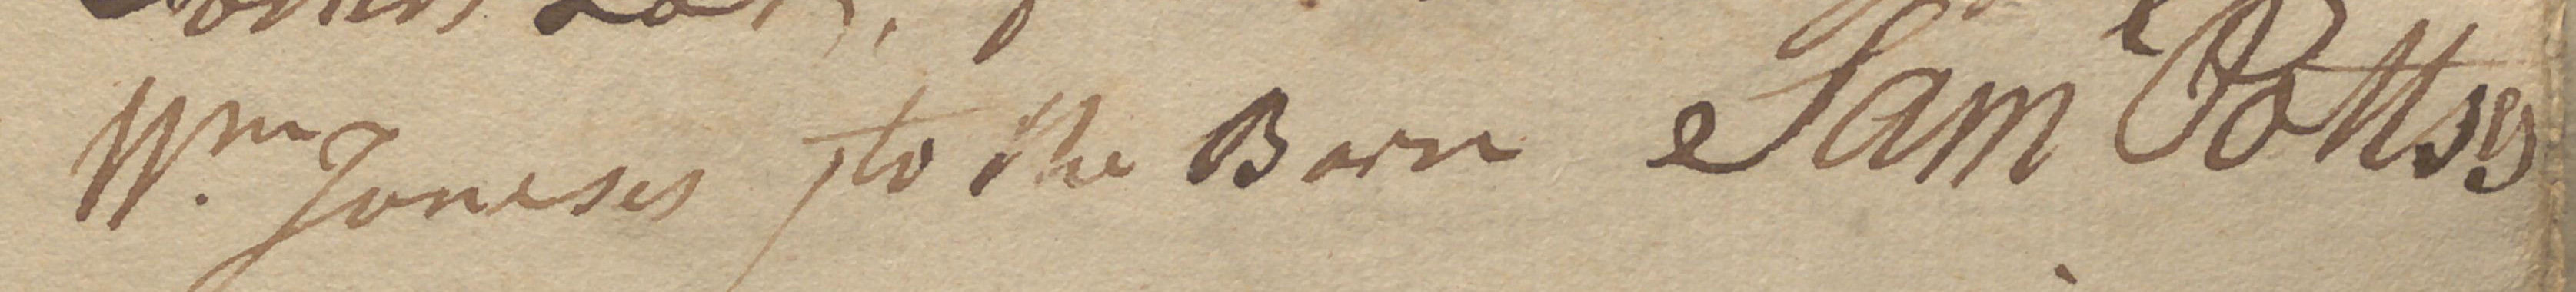W^m. Joneses to the Barn Sam^l Pottses
